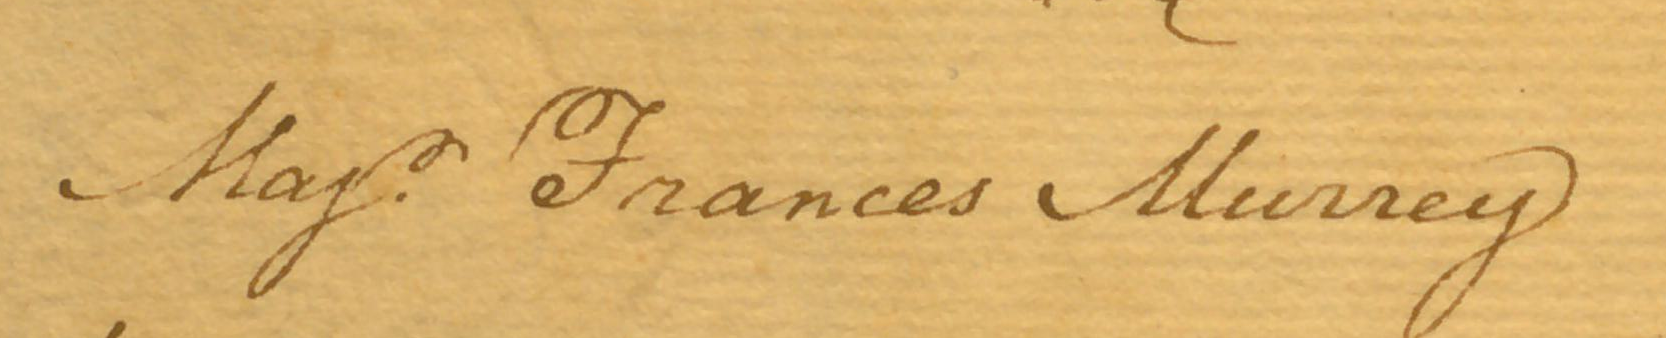Maj^r. Frances Murrey
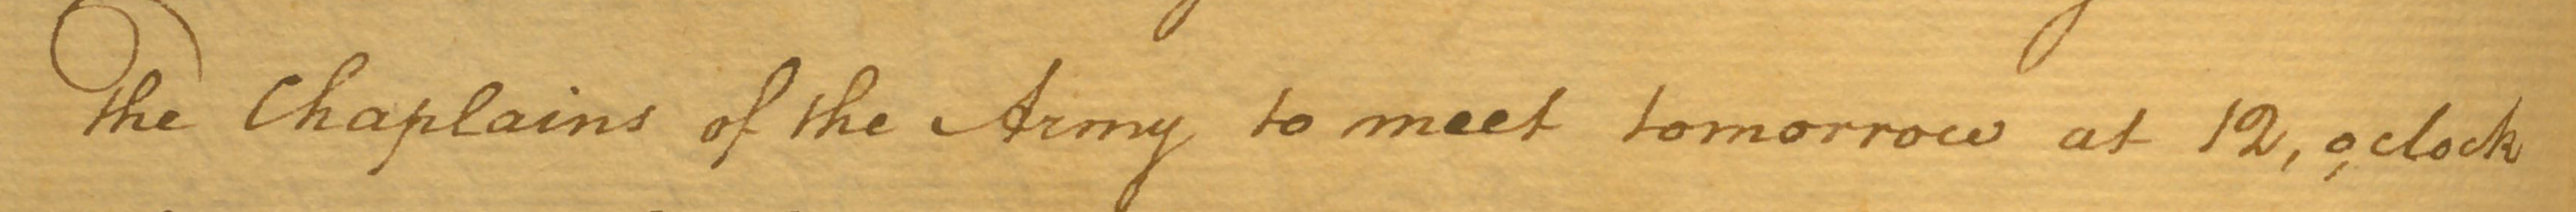The Chaplains of the Army to meet tomorrow at 12, o,clock
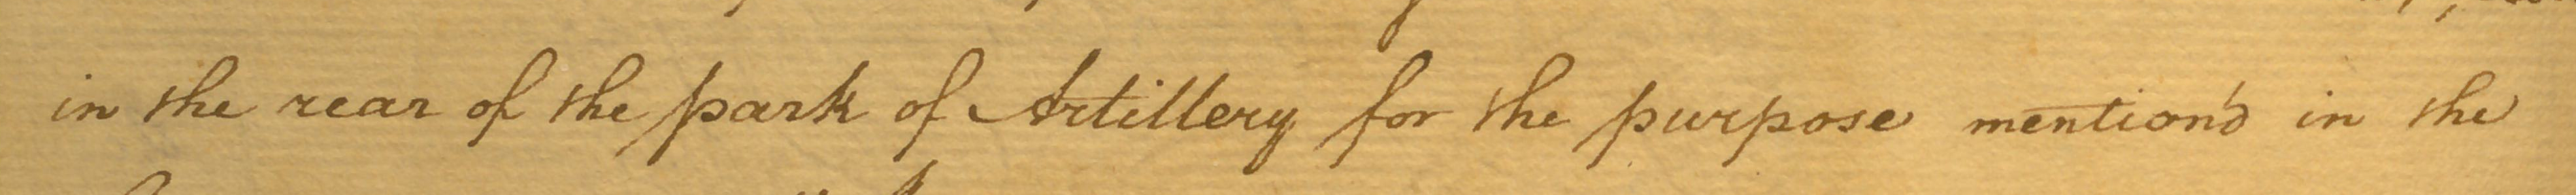in the rear of the park of Artillery for the purpose mention'd in the
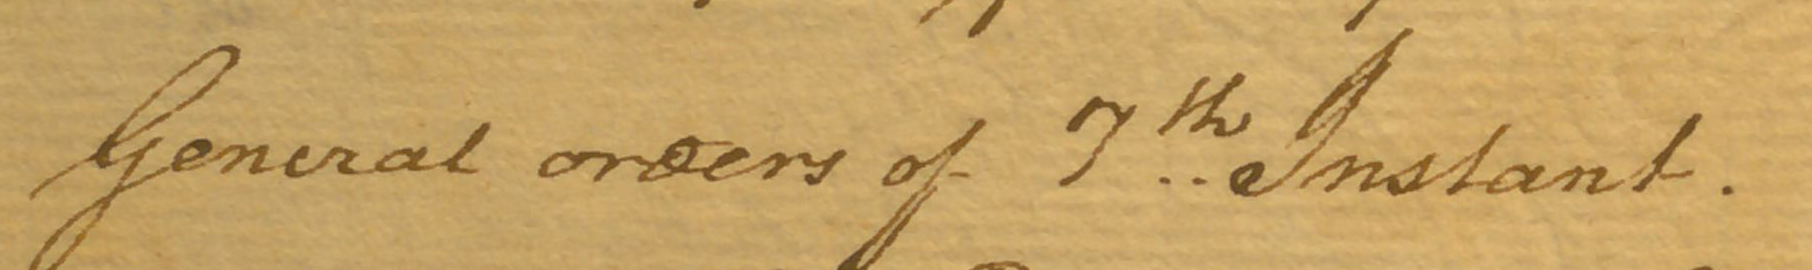General orders of 7^th. Instant.
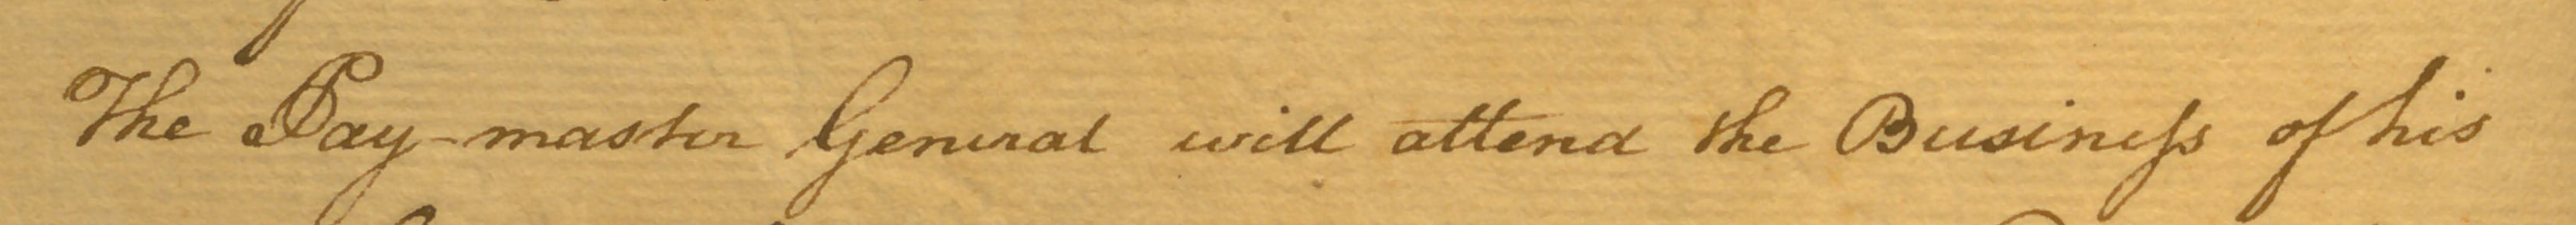The Pay-master General will attend the Business of his
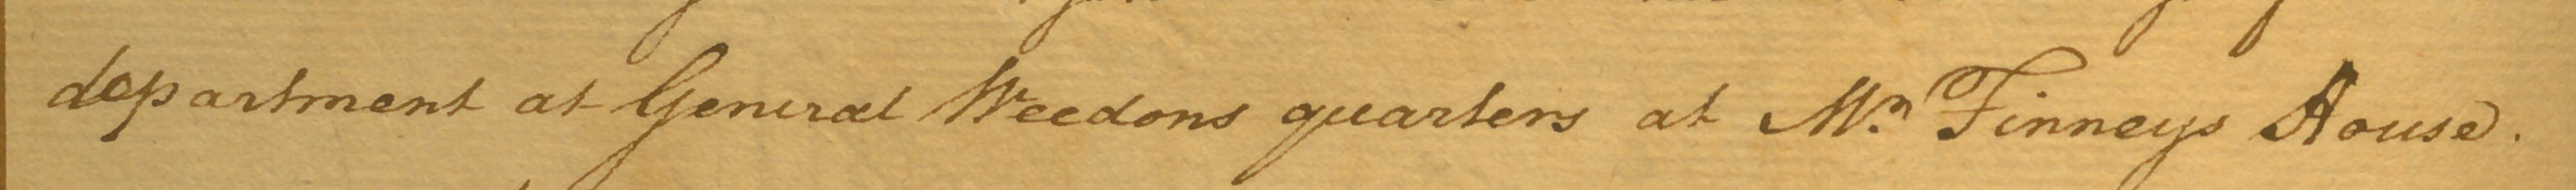department at General Weedons quarters at M^r. Finneys House.
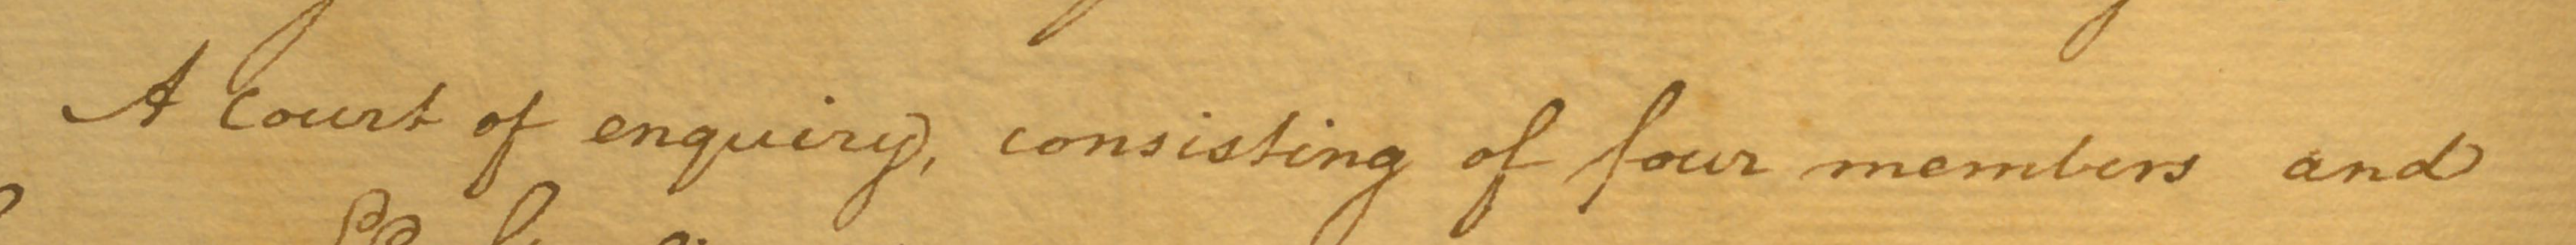A Court of enquiry, consisting of four members and
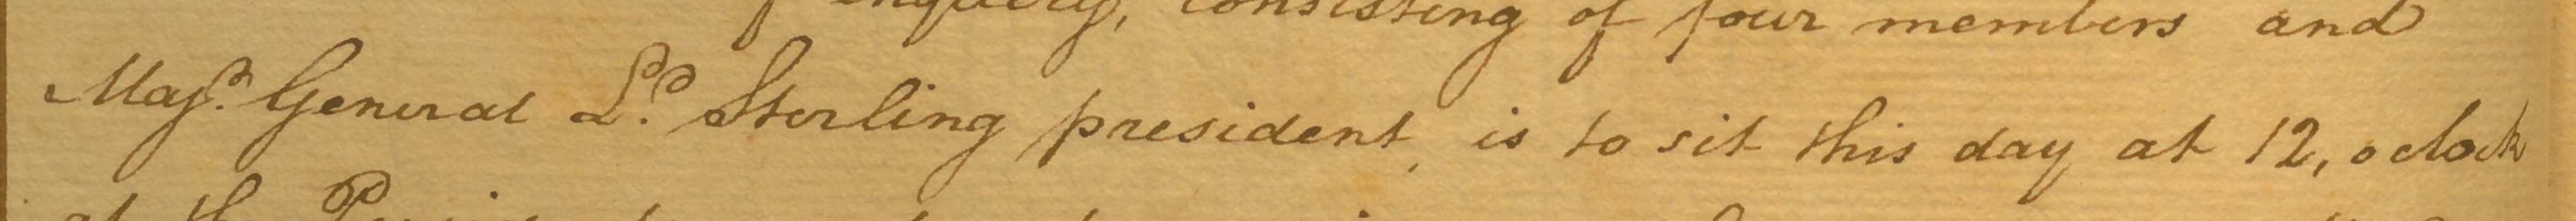Maj^r. General L^d. Sterling president, is to sit this day at 12, oclock
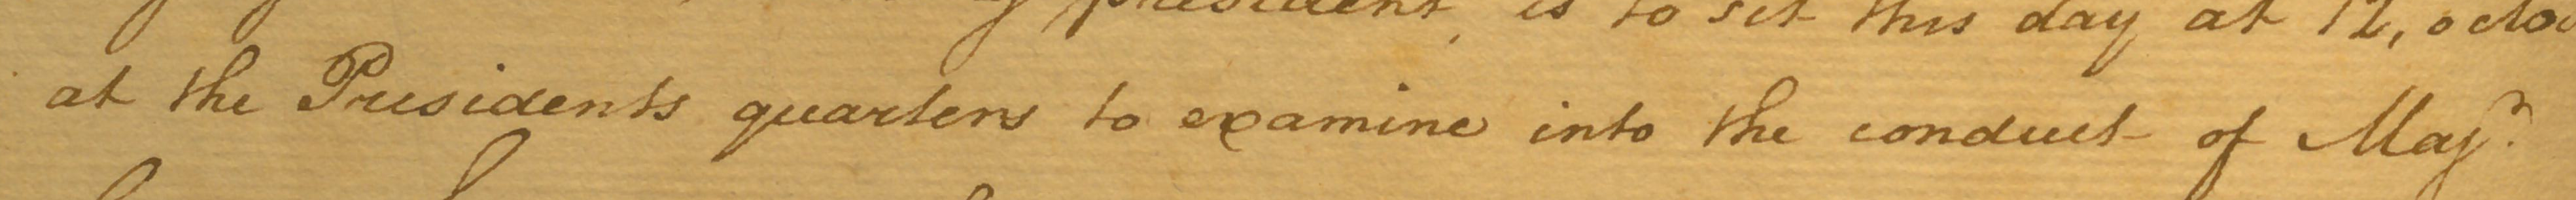at the Presidents quarters to examine into the conduct of Maj^r.
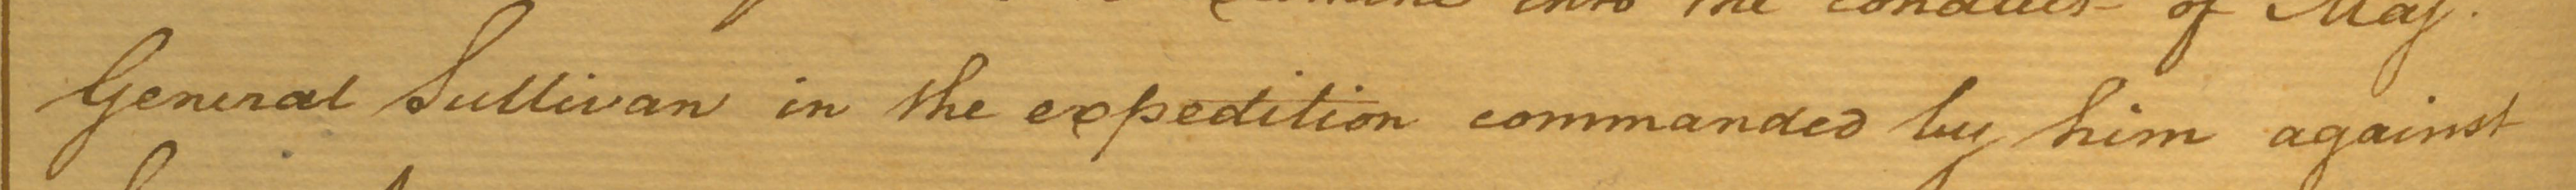General Sullivan in the expedition commanded by him against
